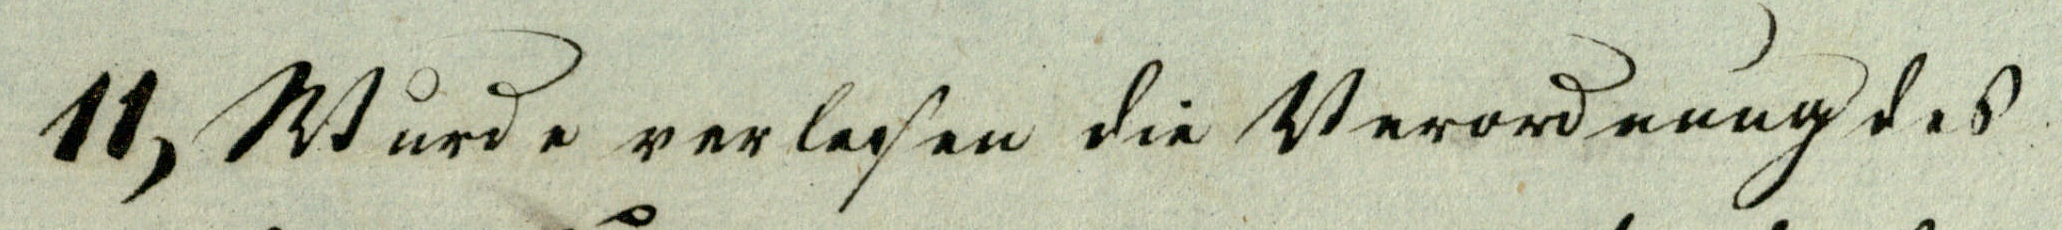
11, Wurde verlesen die Verordnung des
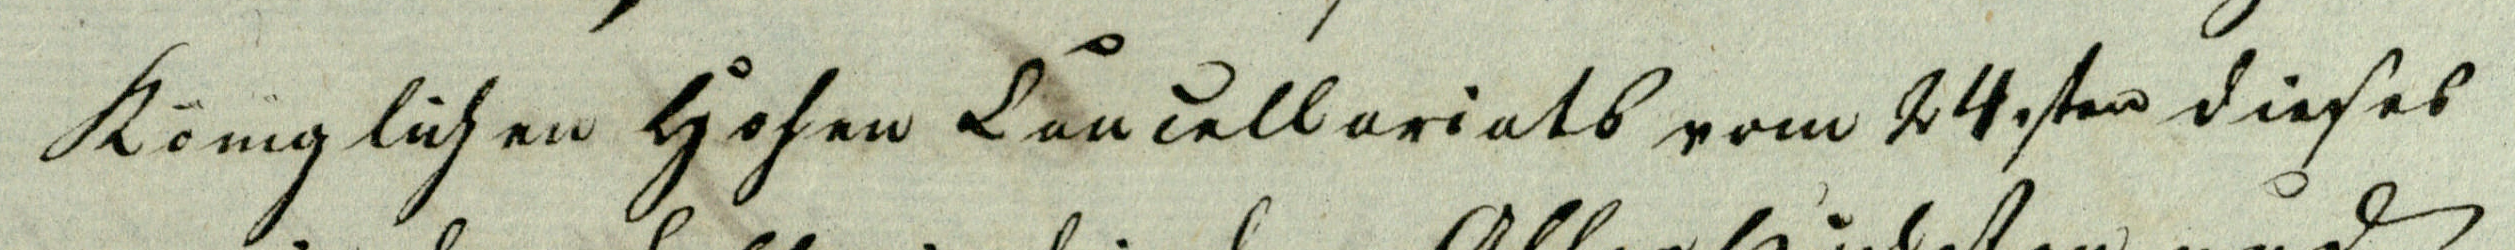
Königlichen Hohen Cancellariats vom 24ten dieses
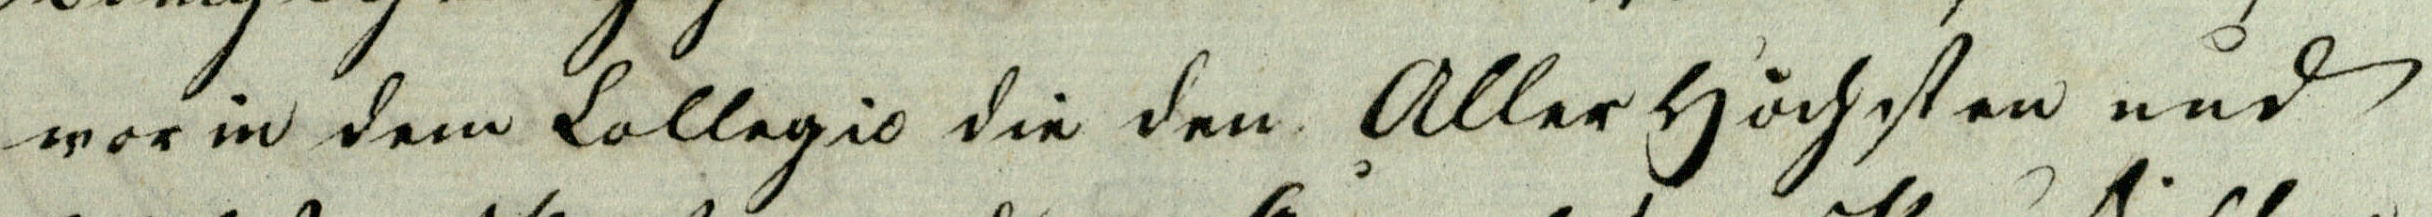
worin dem Collegio die den AllerHöchsten und
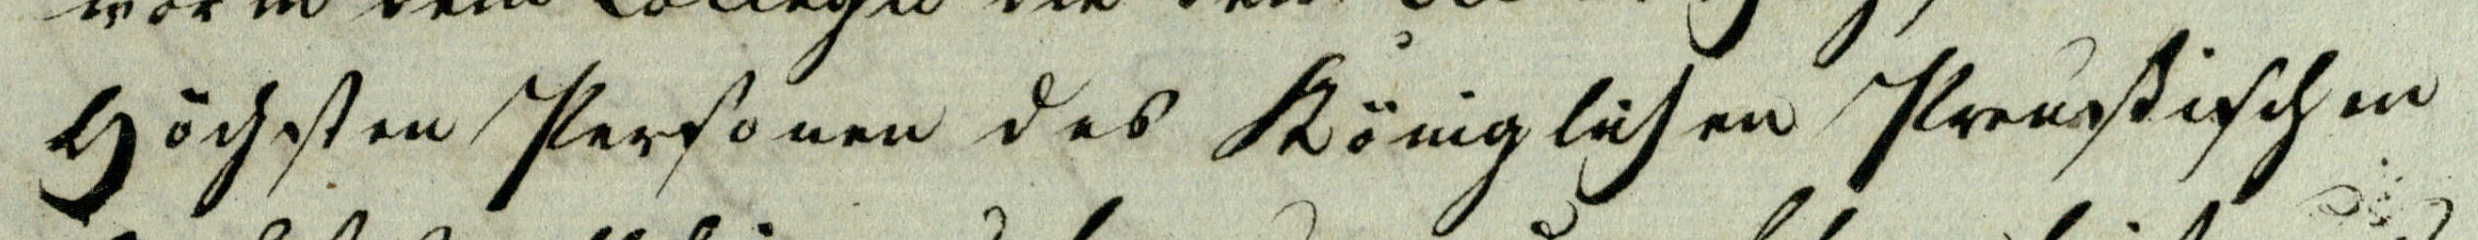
Höchsten Personen des Königlichen Preußischen
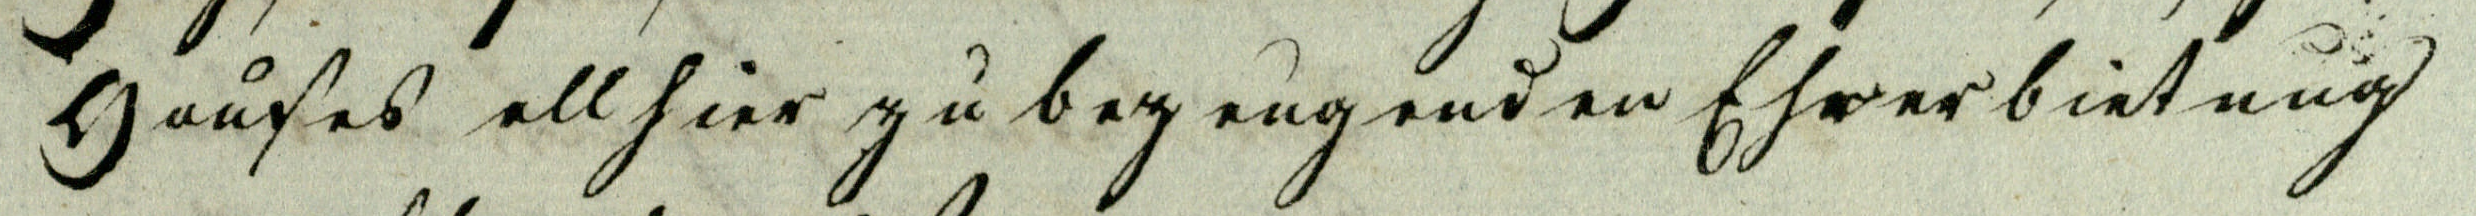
Hauses allhier zu bezeugenden Ehrerbietung
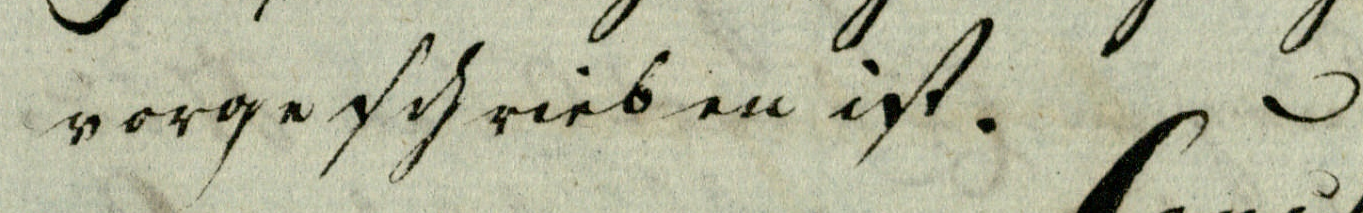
vorgeschrieben ist.
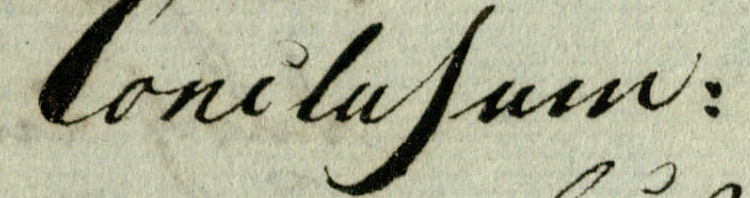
Conclusum:
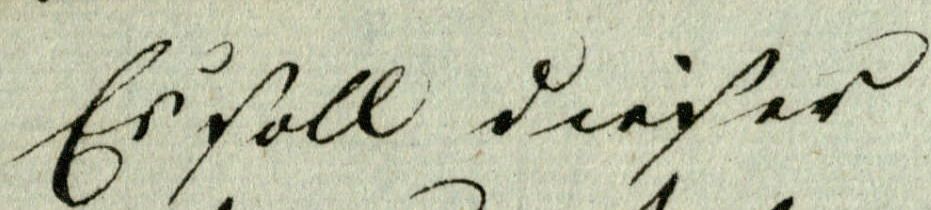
Es soll dieser
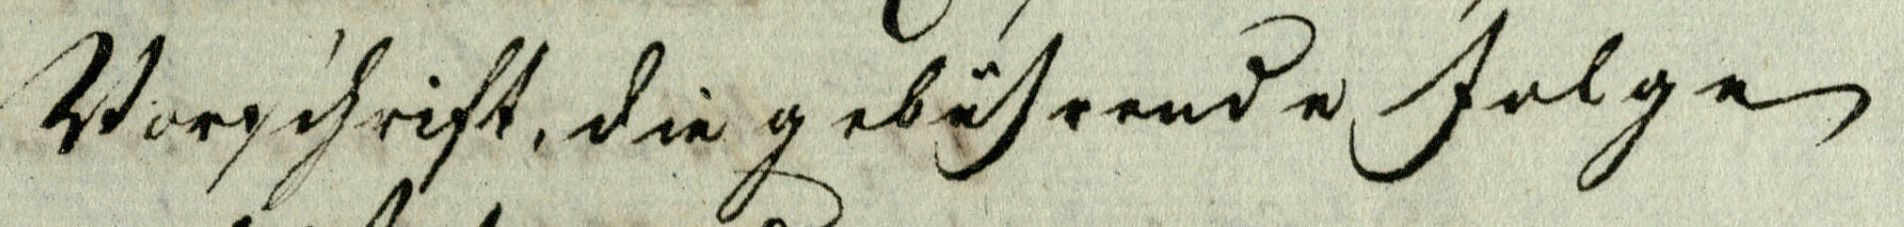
Vorschrift, die gebührende Folge
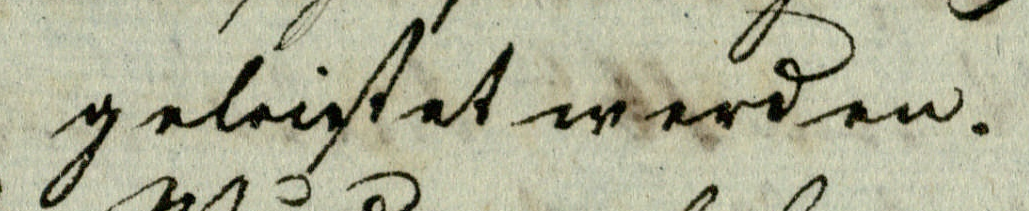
geleistet werden.
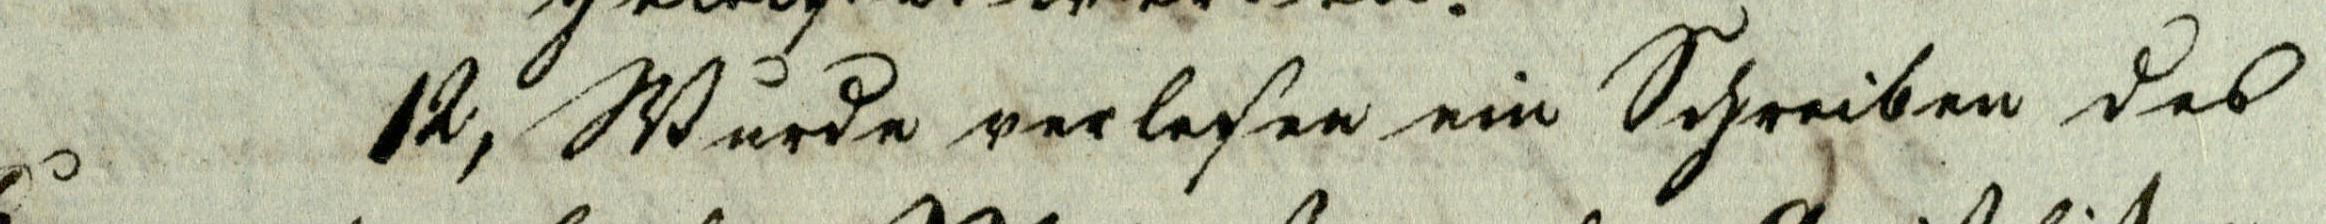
12, Wurde verlesen ein Schreiben des
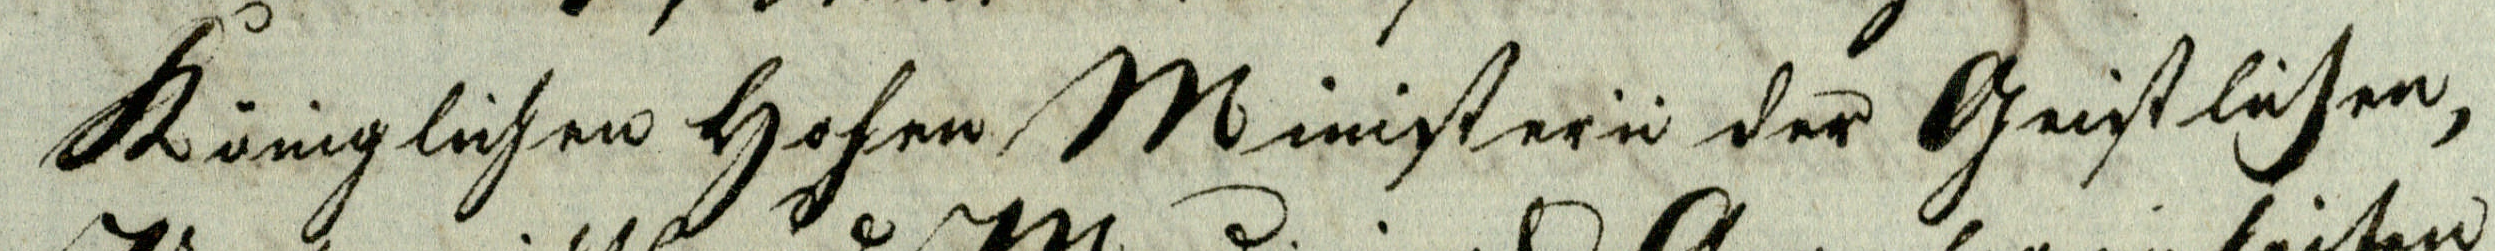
Königlichen Hohen Ministerii der Geistlichen,
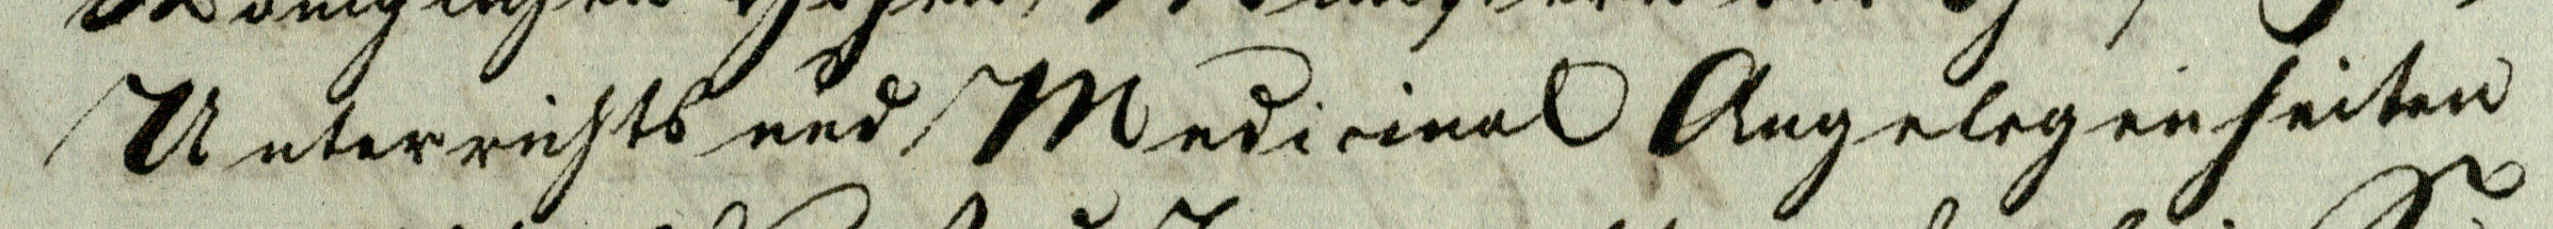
Unterrichts und Medicinal Angelegenheiten
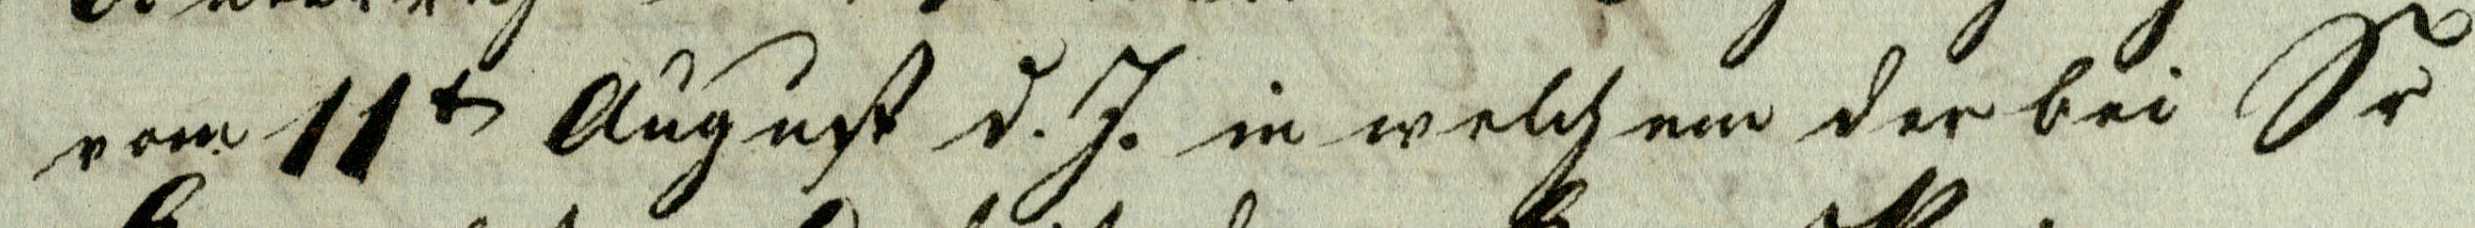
vom 11ten August d. J. in welchem der bei Sr
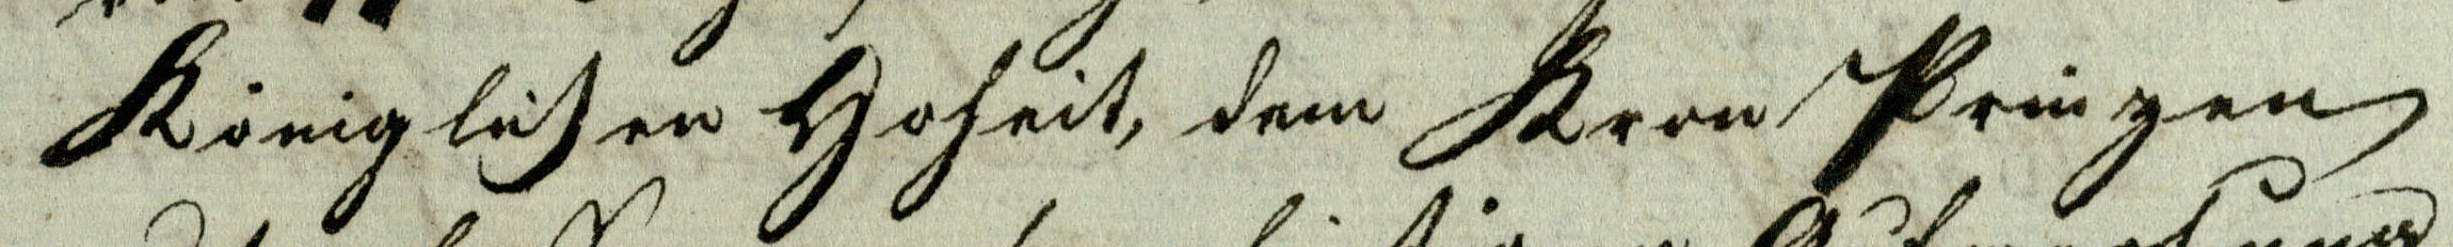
Königlichen Hoheit, dem Kron Prinzen
